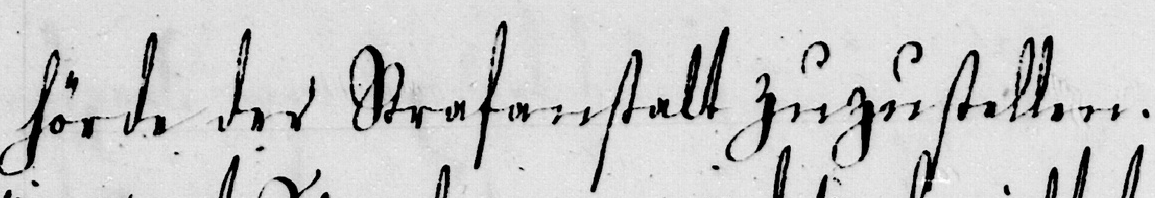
hörde der Strafanstalt zuzustellen.
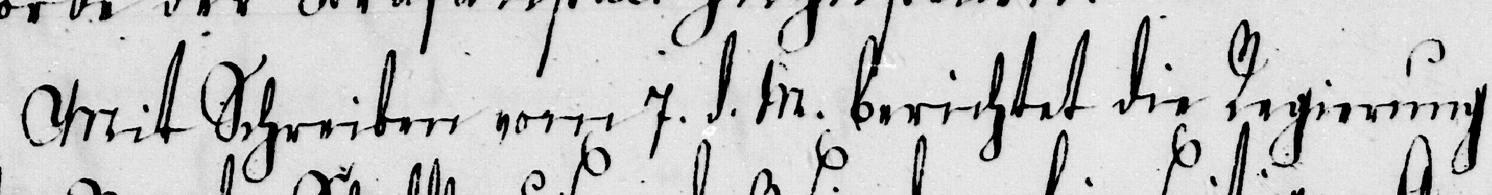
Mit Schreiben vom 7. d. M. berichtet die Regierung
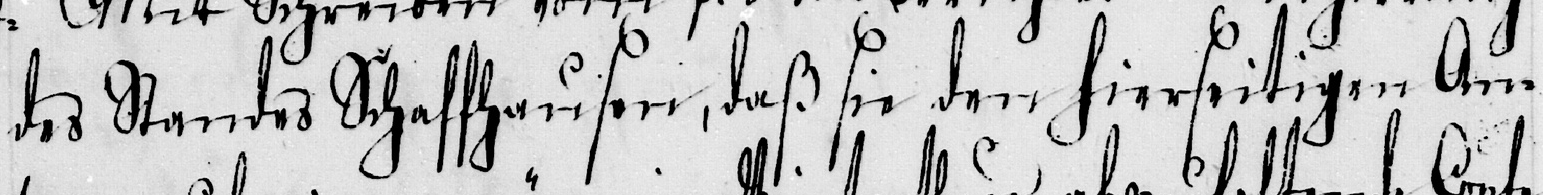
des Standes Schaffhausen, daß sie den hierseitigen An¬
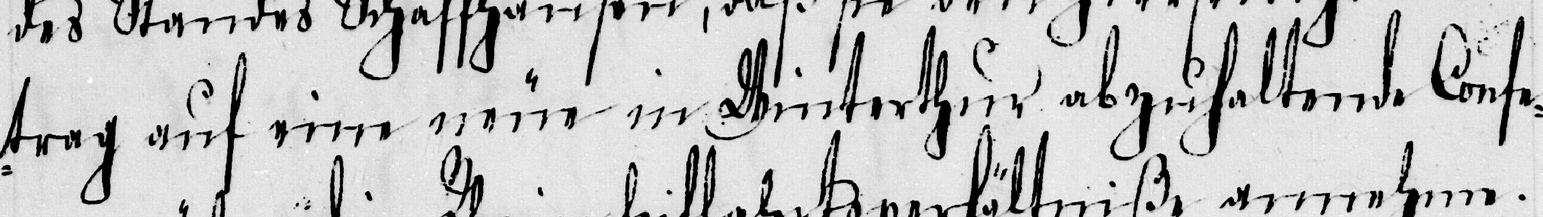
trag auf eine neue in Winterthur abzuhaltende Confe¬
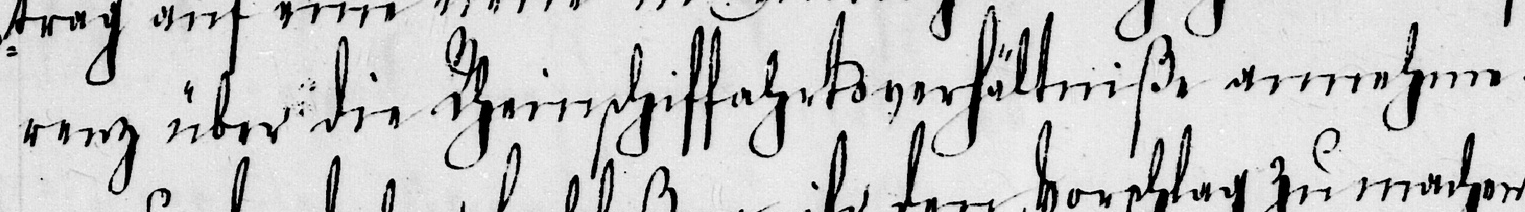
renz über die Rheinschiffahrtsverhältniße annehme.
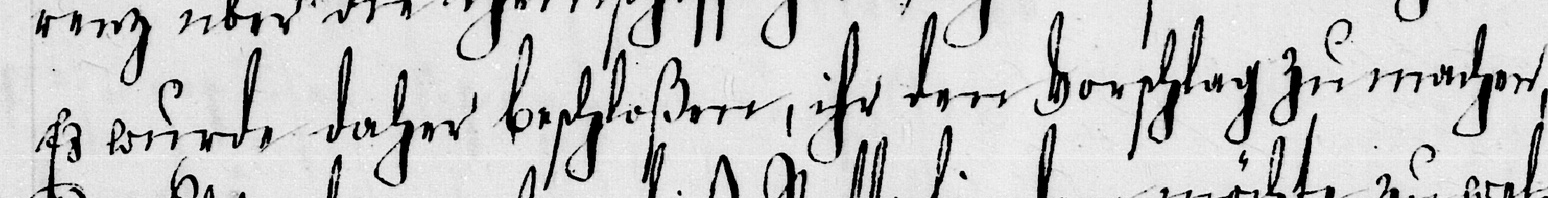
Es wurde daher beschloßen, ihr den Vorschlag zu machen,
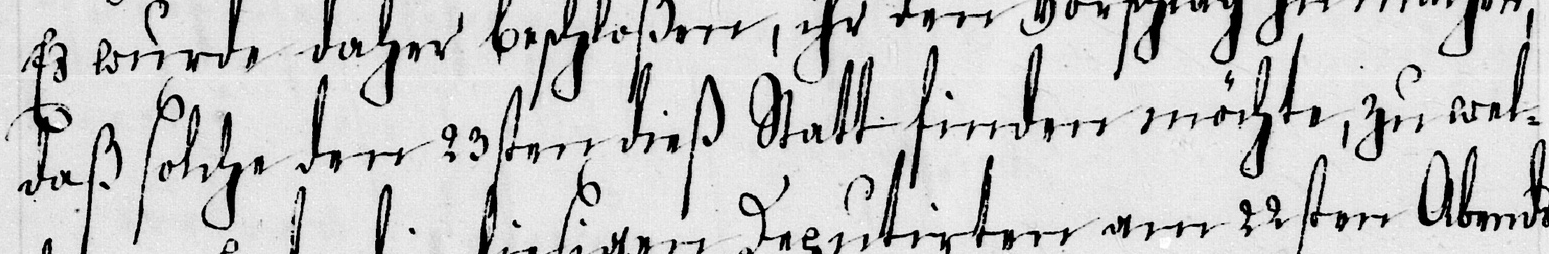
daß solche den 23ten dieß Statt finden möchte, zu wel¬
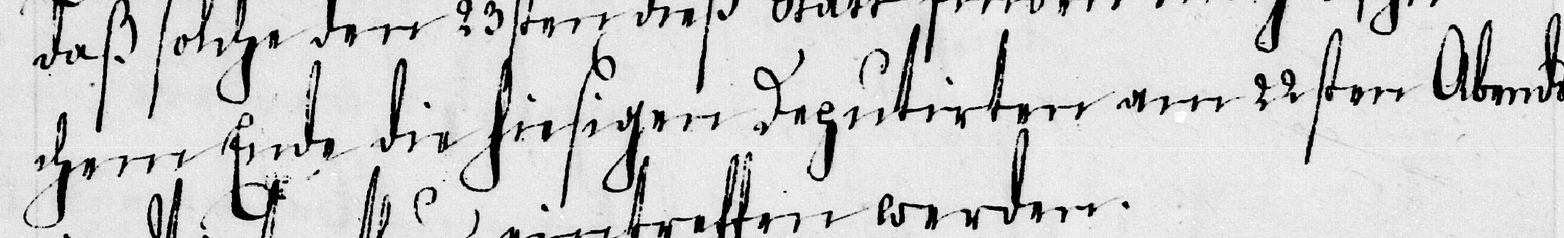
chem Ende die hiesigen Deputirten am 22sten Abends
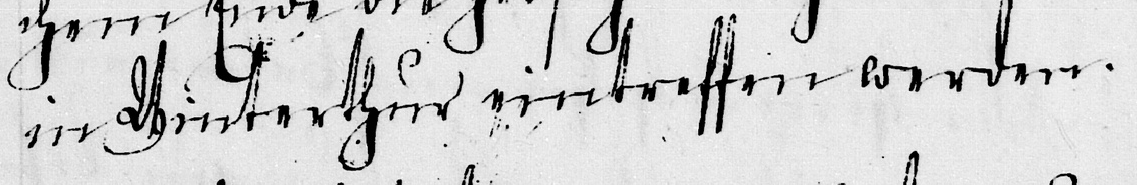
in Winterthur eintreffen werden.
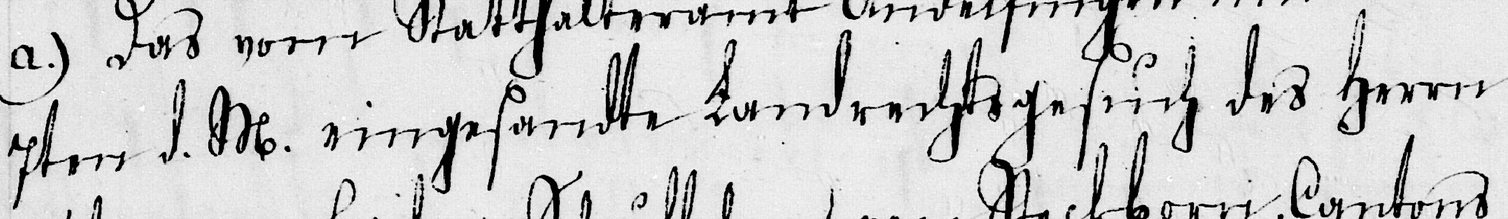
7ten d. M. eingesandte Landrechtsgesuch des Herrn
